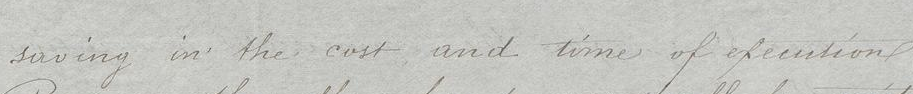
saving in the cost and time of execution.
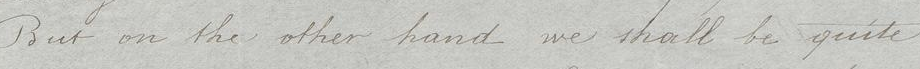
But on the other hand we shall be quite
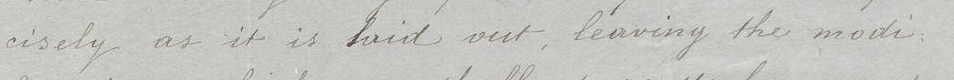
cisely as it is laid out, leaving the modi-
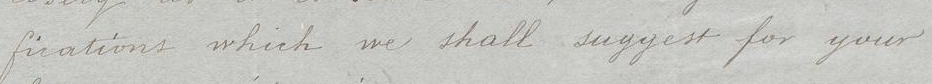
fications which we shall suggest for your
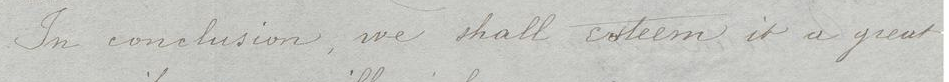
In conclusion, we shall esteem it a great
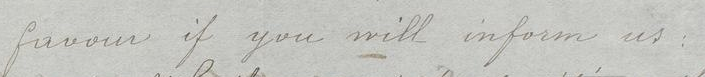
favour if you will inform us:
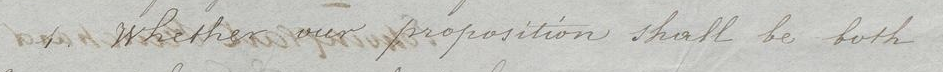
1. Whether our proposition shall be both
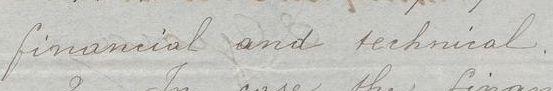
financial and technical.
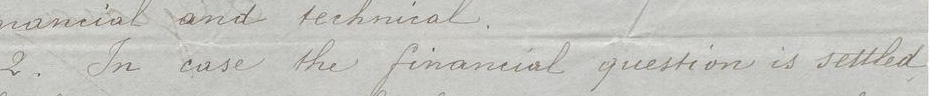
2. In case the financial question is settled
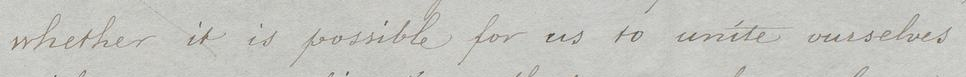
whether it is possible for us to unite ourselves
